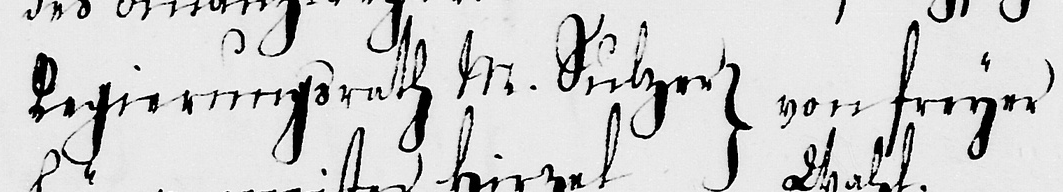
Regierungsrath M. Sulzer von freyer
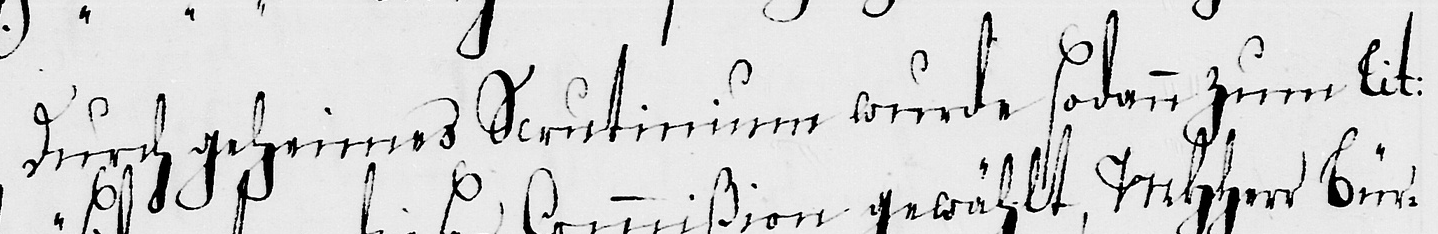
Durch geheimes Scrutinium wurde sodann zum Lit.
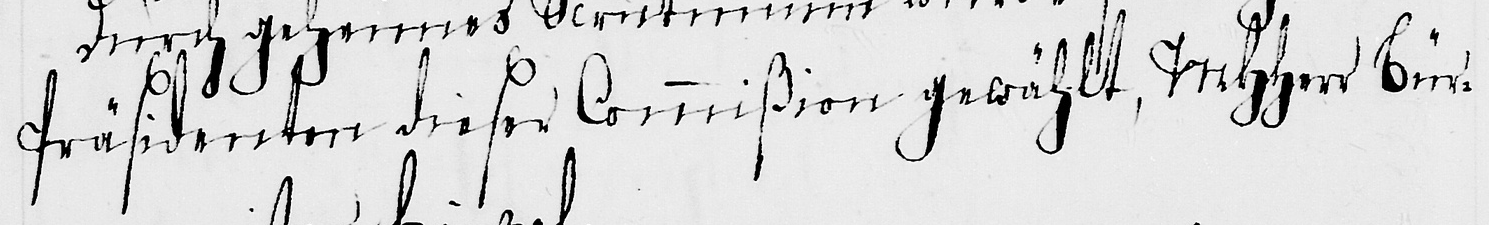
Präsidenten dieser Commißion gewählt, MHHerr Bür¬
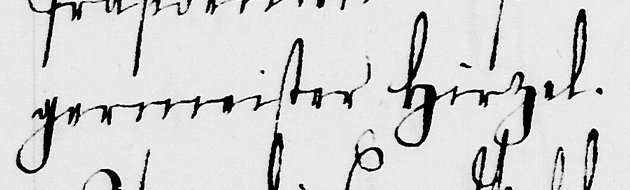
germeister Hirzel.
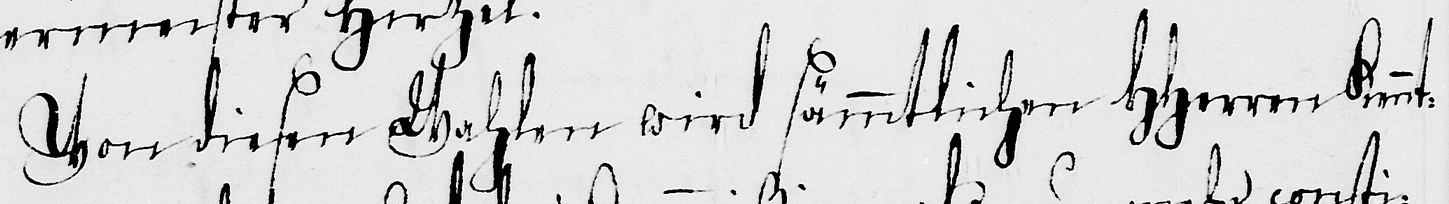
Von diesen Wahlen wird sämmtlichen HHerren Ken¬
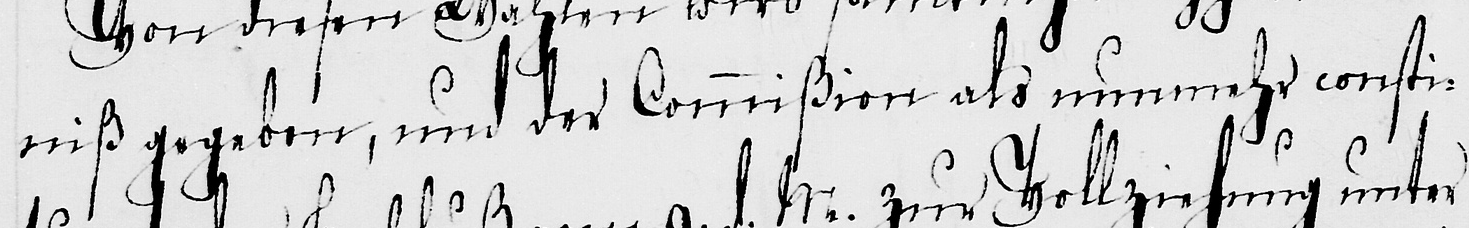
ntniß gegeben, und der Commißion als nunmehr consti¬
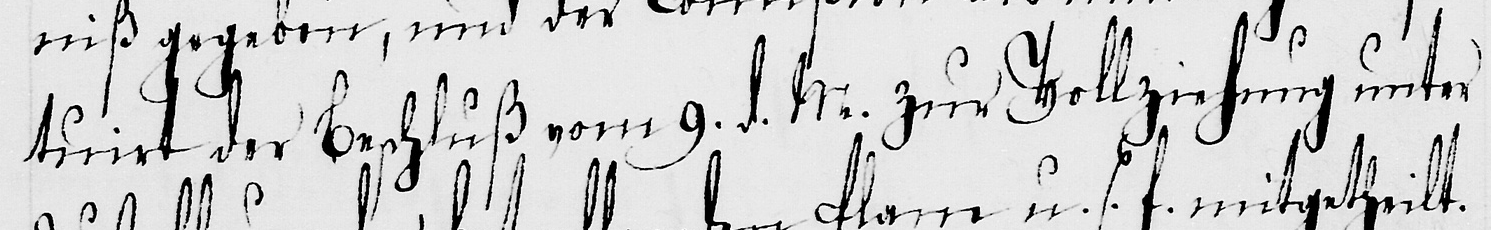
tuirt der Beschluß vom 9. d. M. zur Vollziehung unter
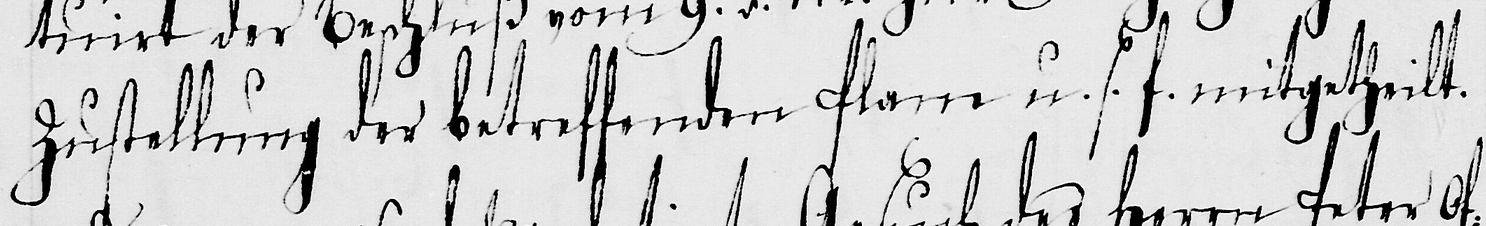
Zustellung der betreffenden Plane u.s.f. mitgetheilt.
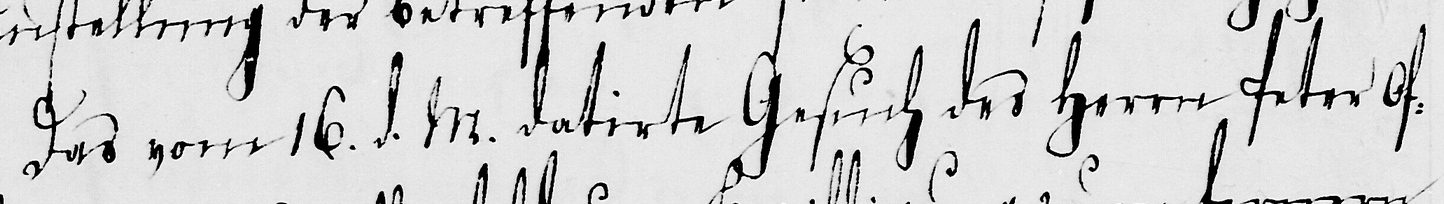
Das vom 16. d. M. datirte Gesuch des Herrn Peter Of¬
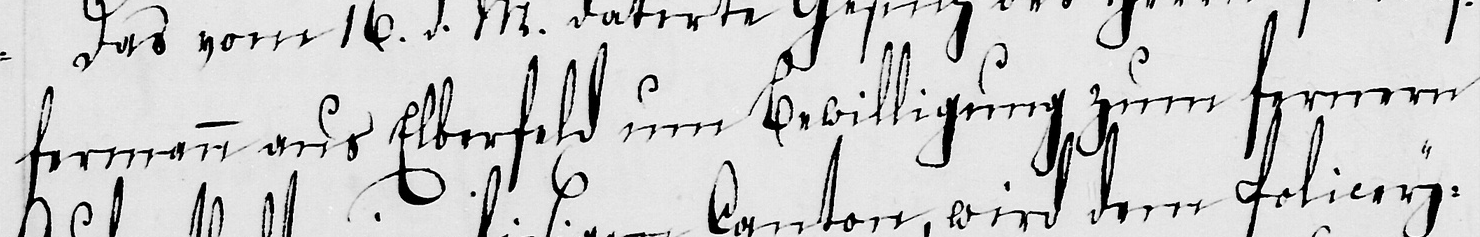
fermann aus Elberfeld um Bewilligung zum fernern
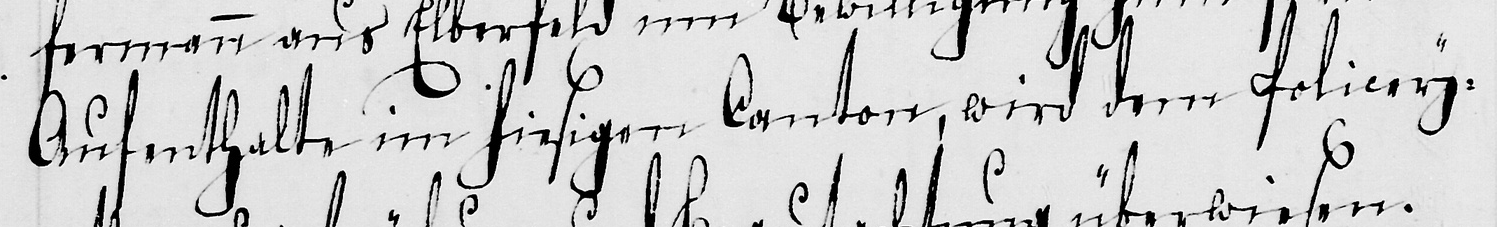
Aufenthalte im hiesigen Canton, wird dem Policey¬
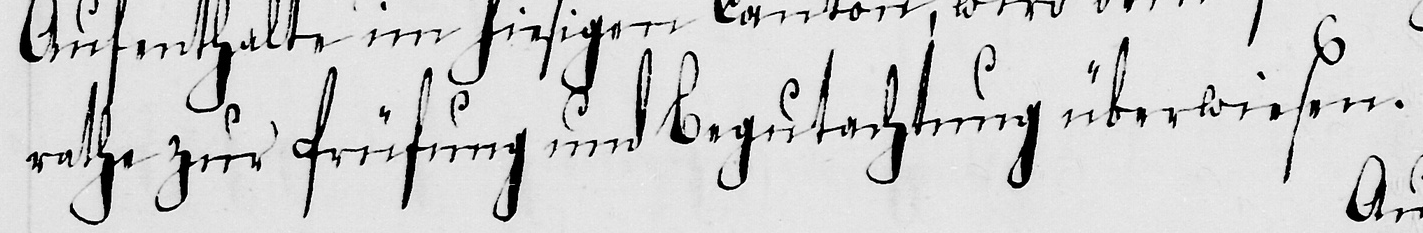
rathe zur Prüfung und Begutachtung überwiesen.
